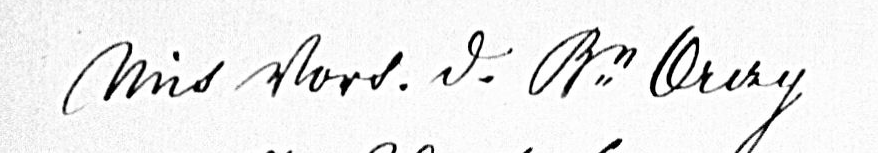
Mis Vors. d. Bn Orczy
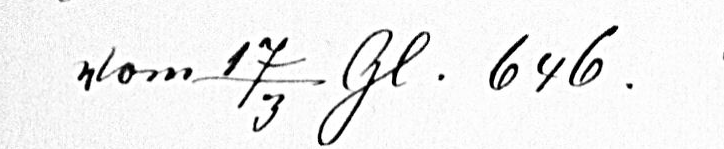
vom 17/3 Zl. 646.
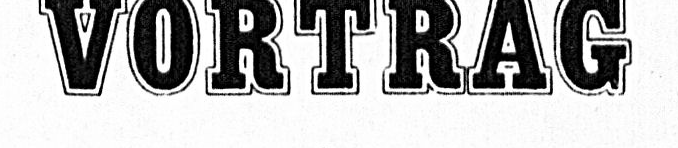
VORTRAG
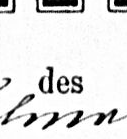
des
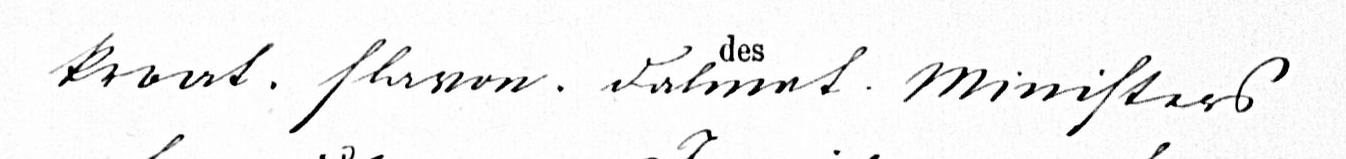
kroat. slavon. dalmet. Ministers
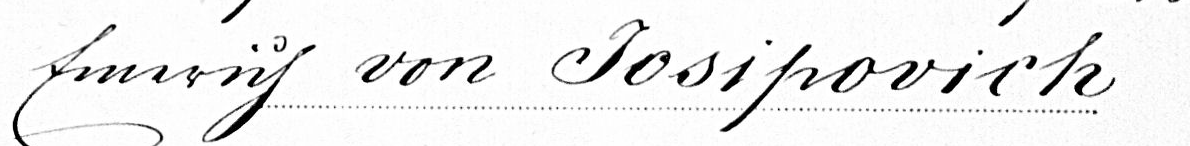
Emerich von Josipovich
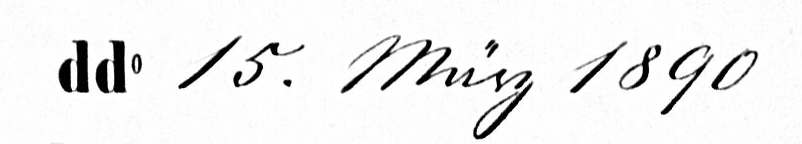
dd° 15. März 1890
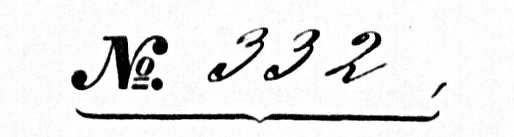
N° 332.
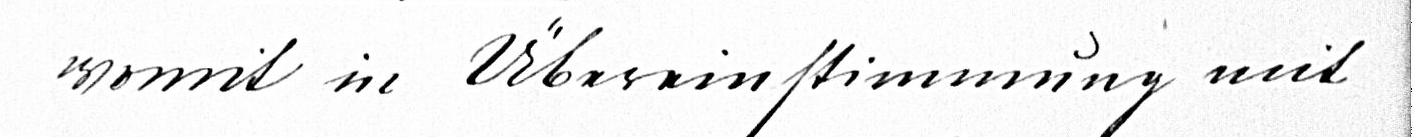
womit in Übereinstimmung mit
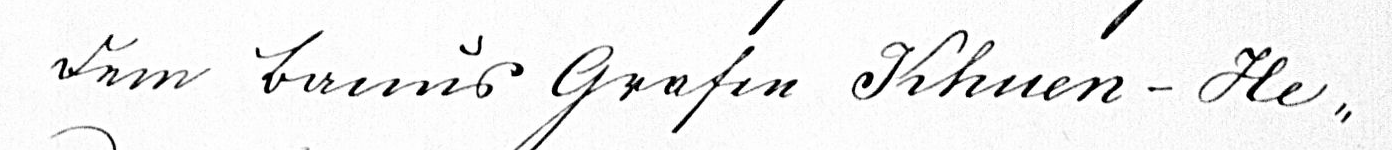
dem Banus Grafen Khuen - He¬
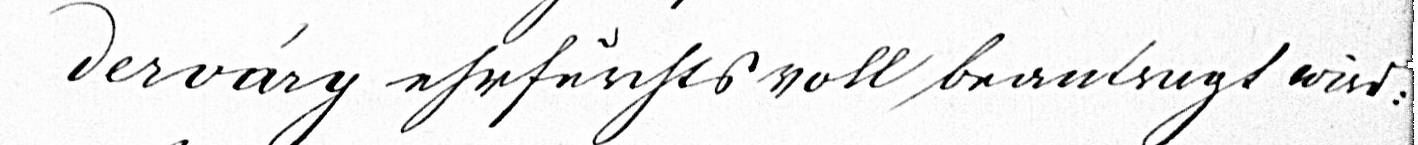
derváry ehrfurchtsvoll beantragt wird:
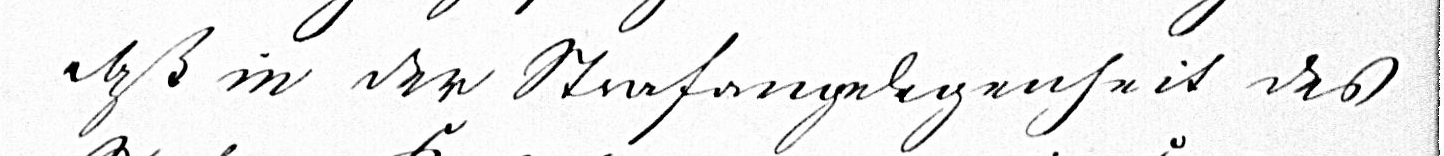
daß in der Strafangelegenheit des
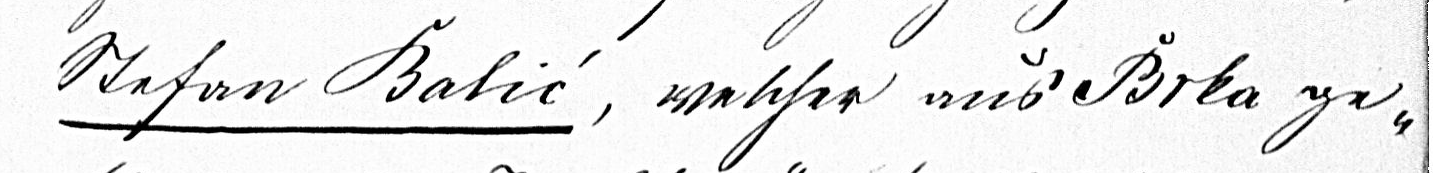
Stefan Balić, welcher aus Brka ge¬
